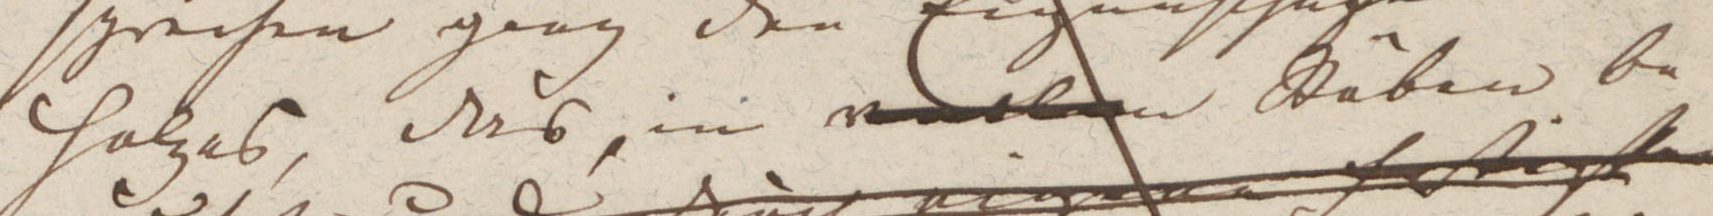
Holzes, das, in Stäben be-
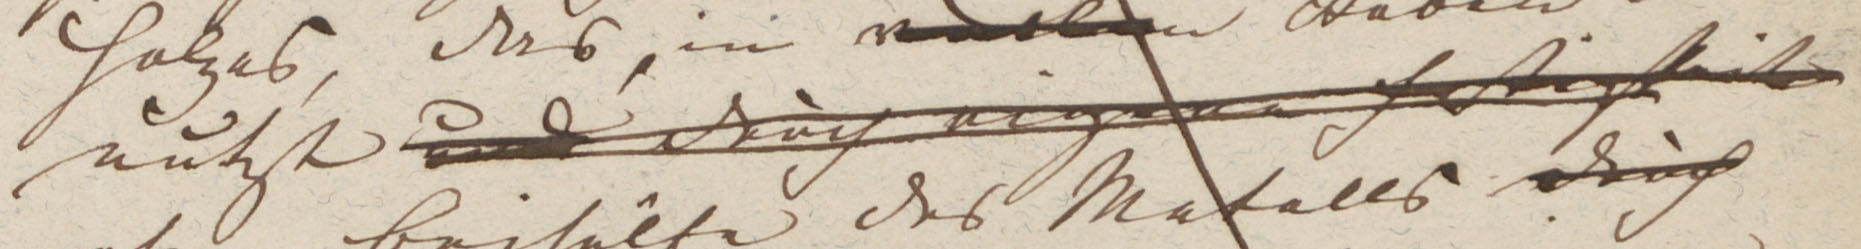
nutzt und durch eigene Festigkeit
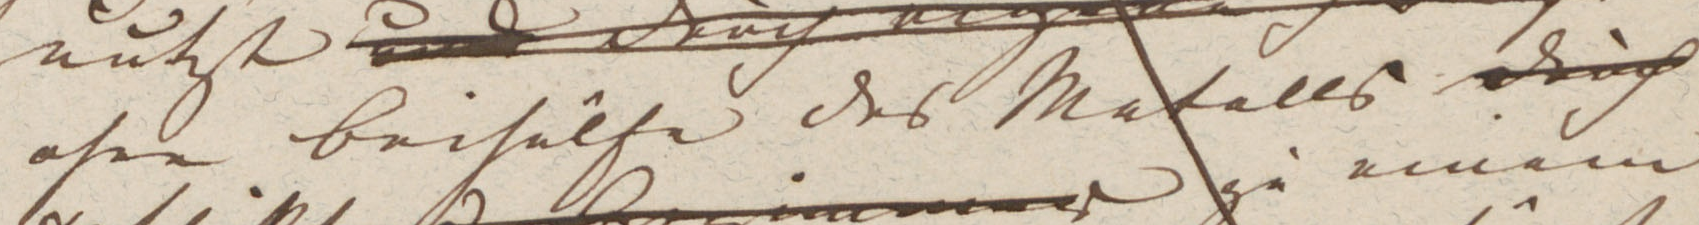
ohne Beihülfe des Metalls durch
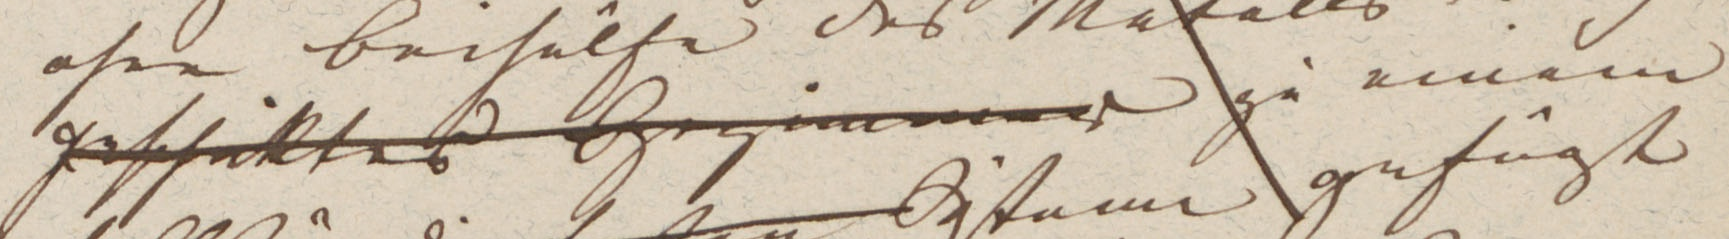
geschicktes Gezimmer zu einem
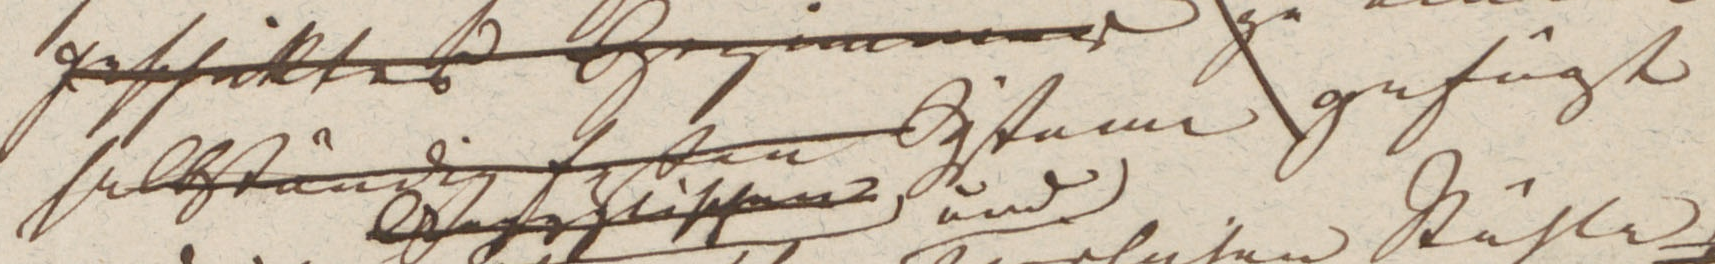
selbständig festen System gefügt
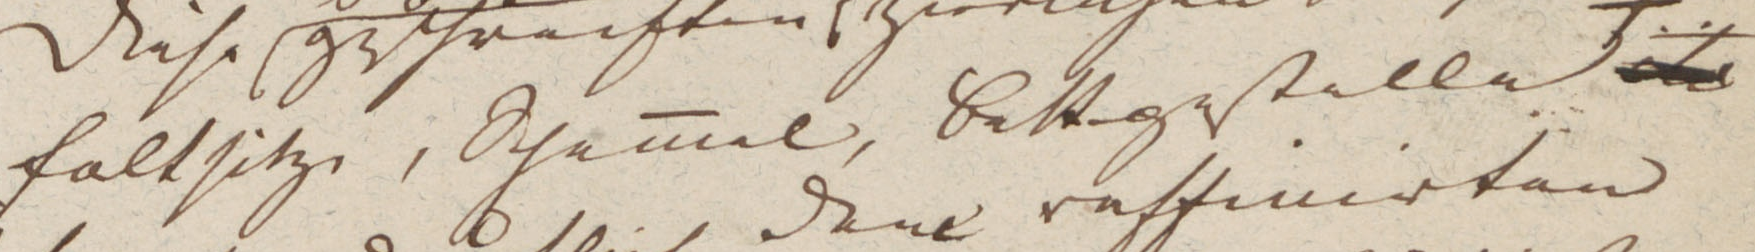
Faltsitze, Schemmel, Bettgestelle % etc
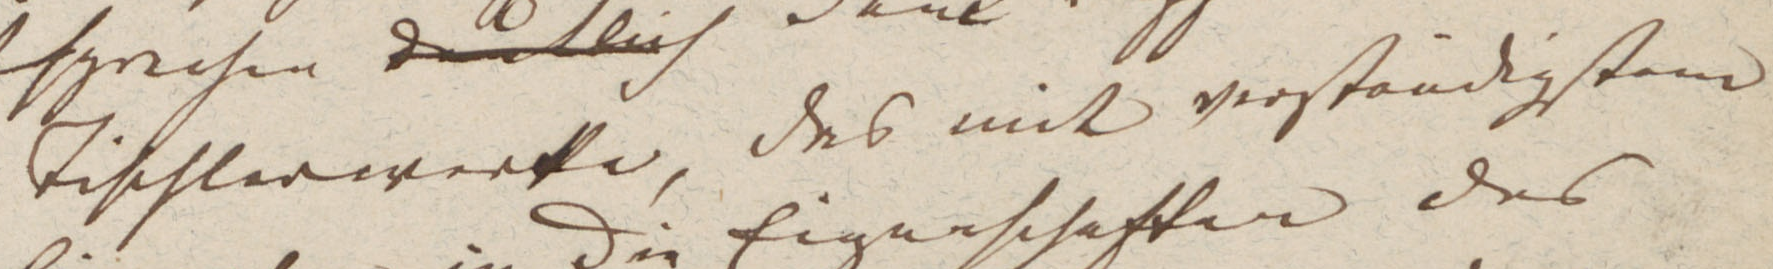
Tischlerwerke, das mit verständigstem
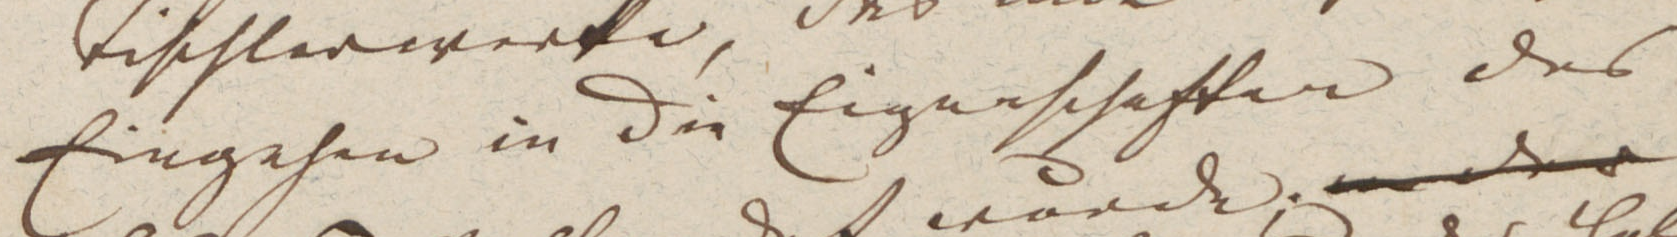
Eingehen in die Eigenschaften des
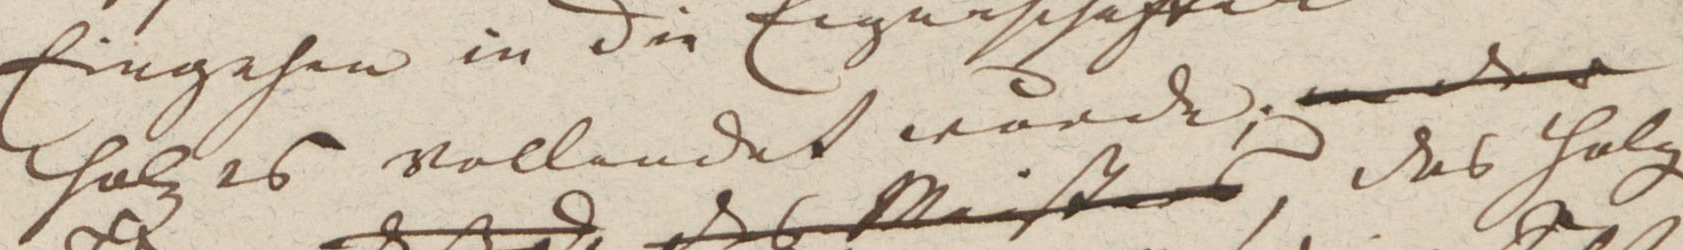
Holzes vollendet wurde; der
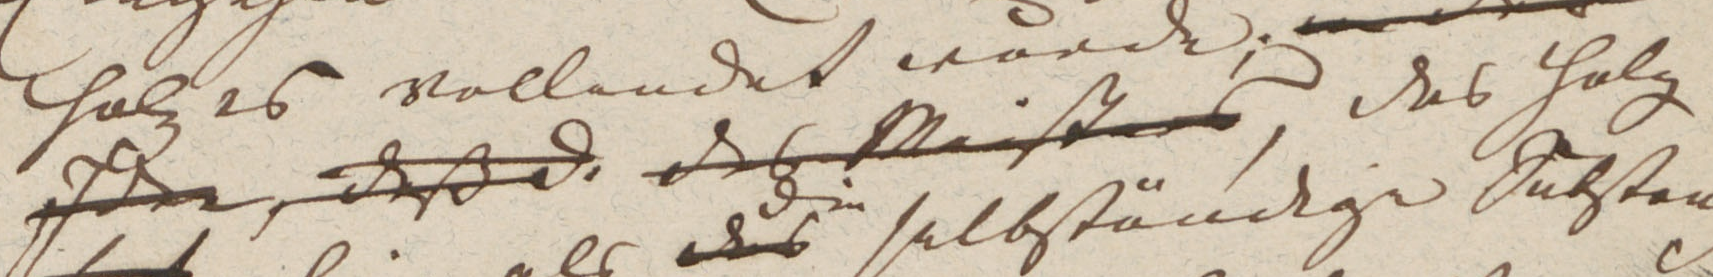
Idee, dass d des Meisters, das Holz
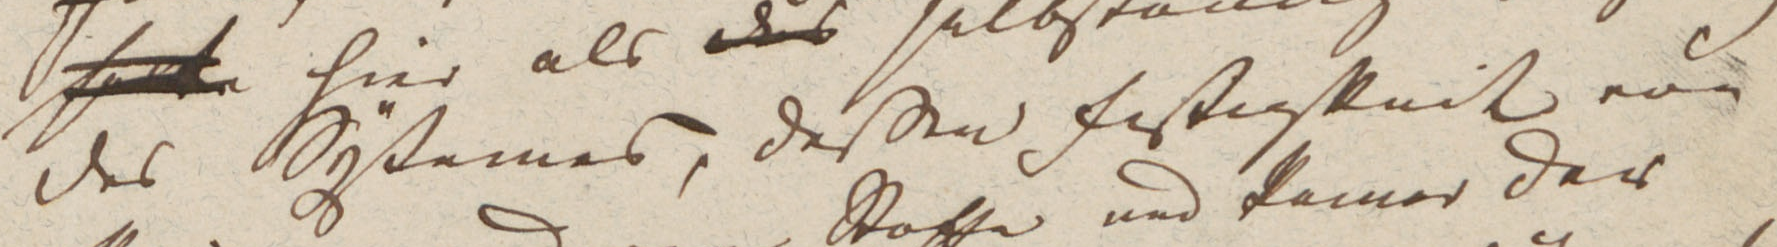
des Systemes, dessen Festigkeit von
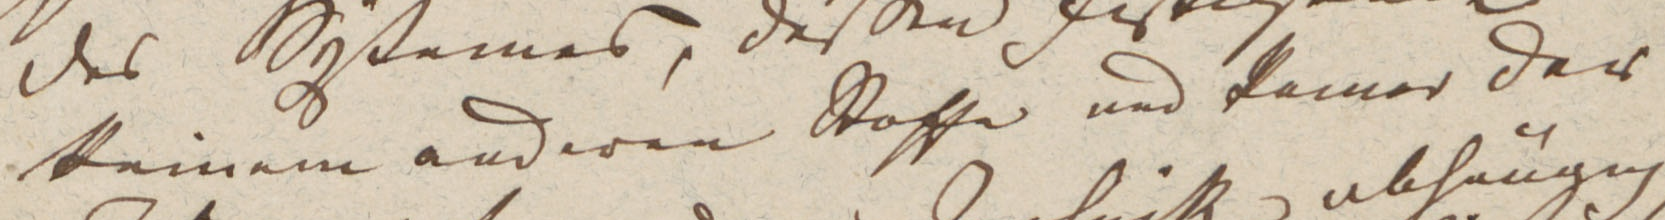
keinem anderen Stoffe und keiner der
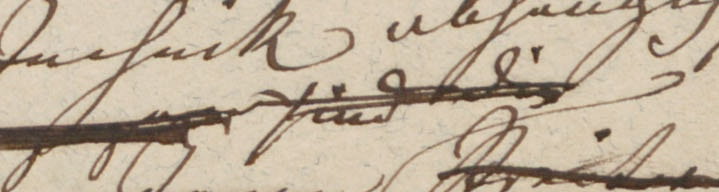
ist hervortreten. Jene Dagegen
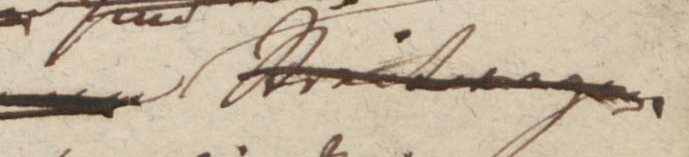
sind die Streitwagen
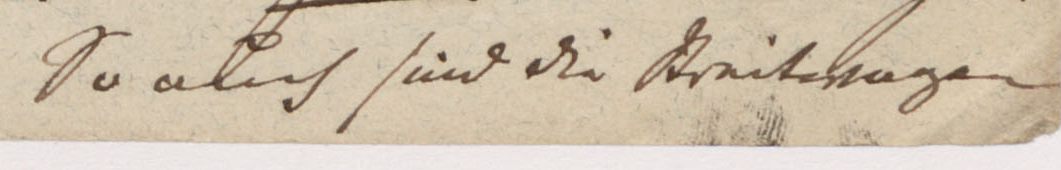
So auch sind die Steitwagen
